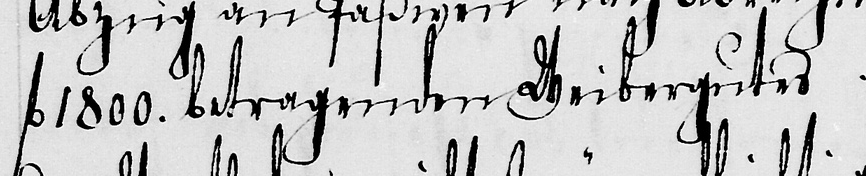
fl. 1800. betragenden Weibergutes
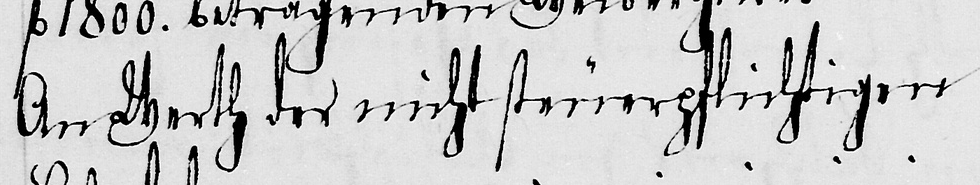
An Werth der nicht steuerpflichtigen
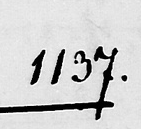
1137.
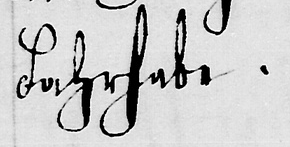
Fahrhabe
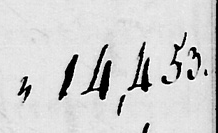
14,453.
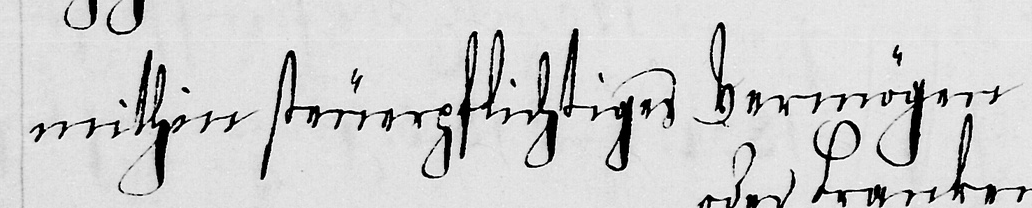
mithin steuerpflichtiges Vermögen
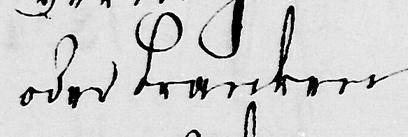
oder Franken
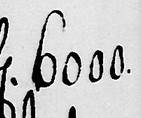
6000.
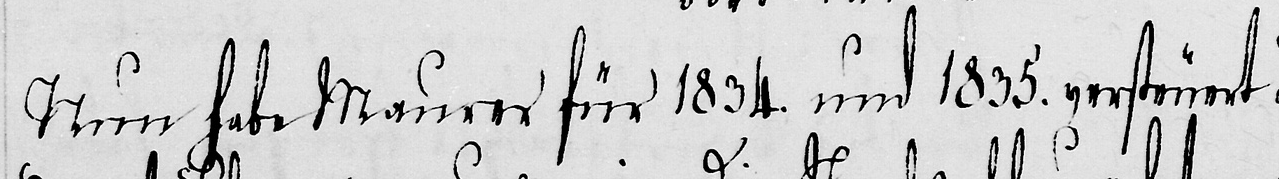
Nun habe Maurer für 1834. und 1835. versteuert
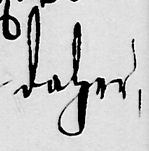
dahe¬
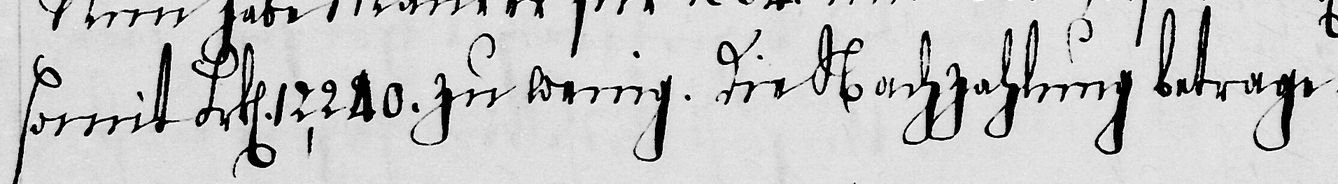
somit Frk[en]. 12,240. zu wenig. Die Nachzahlung betrage
